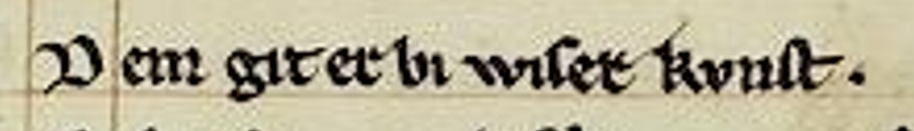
Dem git er bi wiſer kvnſt.
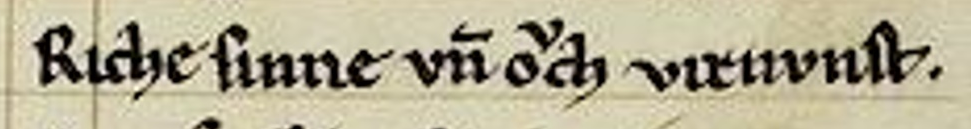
Riche ſinne vn(d) o°vch virnvnſt.
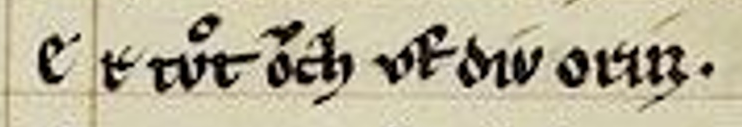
Er tv°ot o°vch vf div orin.
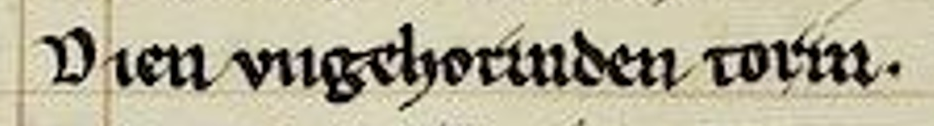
Dien vngehorinden torin.
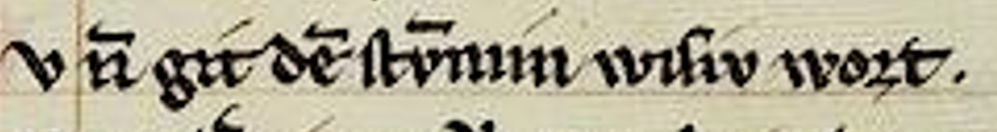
Vn(d) git de(n) ſtv(m)min wiſiv wort.
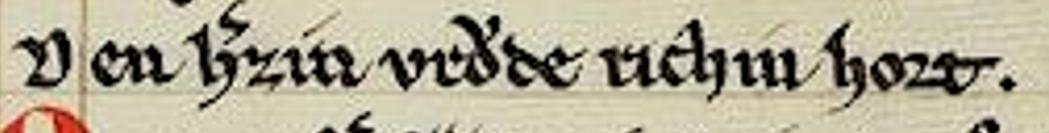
Den h(er)zin vro°vde richin hort.
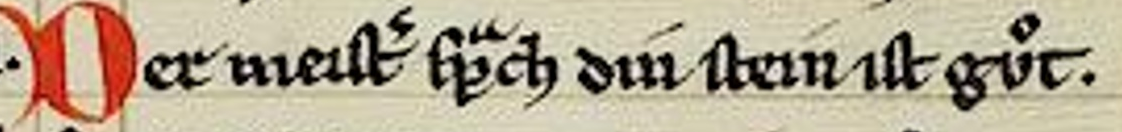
*Der meiſt(er) ſp(ra)ch din ſtein iſt gv°ot.
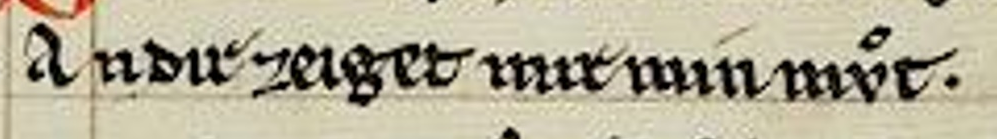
An dir zeiget mir min mv°ot.
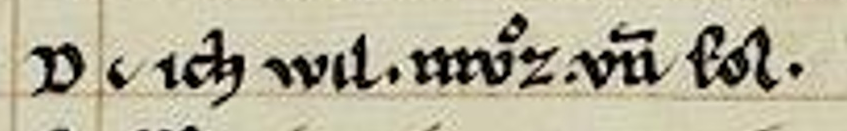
D(az) ich wil. mv°oz. vn(d) ſol.
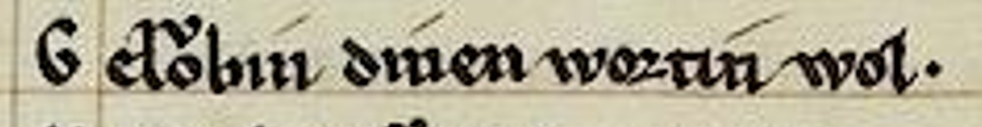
Gelo°vbin dinen wortin wol.
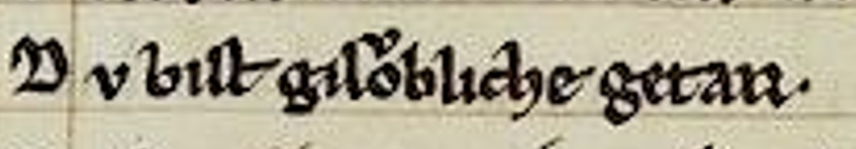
Dv biſt gilo°vbliche getan.
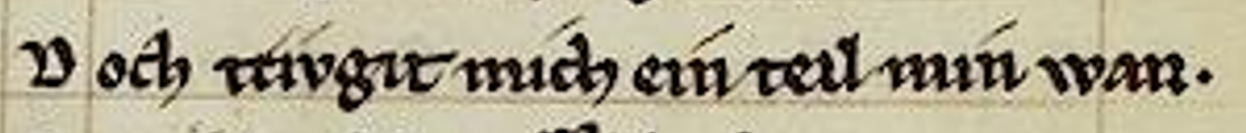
Doch trivgit mich ein teil min wan.
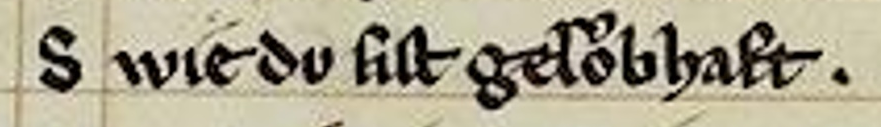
Swie dv ſiſt gelo°vbhaft.
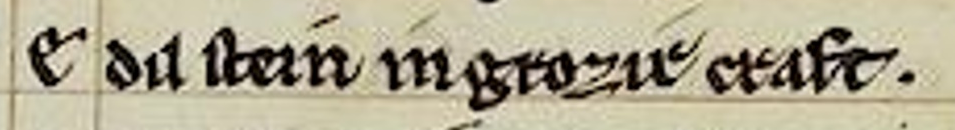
Edil ſtein in grozir craft.
